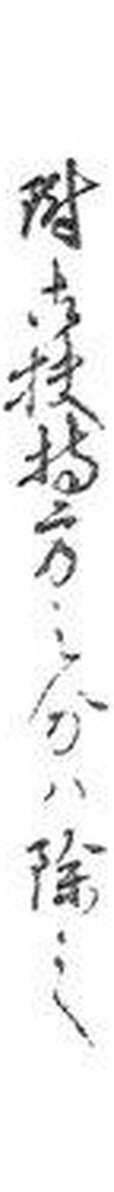附御扶持方之分ハ除之
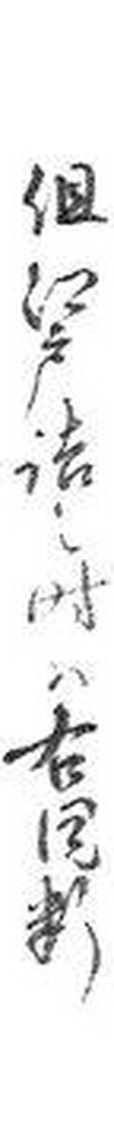但江戸詰之時ハ右同断
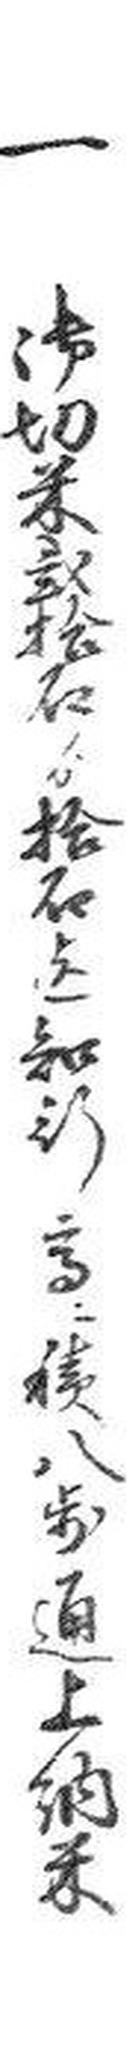一御切米弐拾石ゟ拾石迄知行高ニ積八歩通上納米
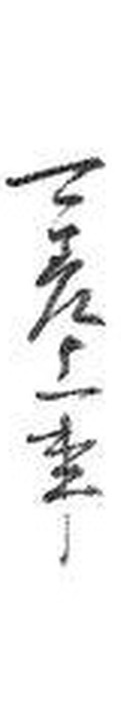可差上事
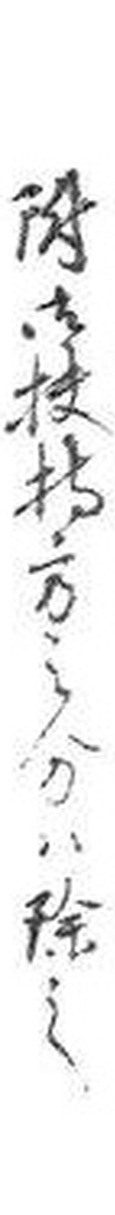附御扶持方之分ハ除之
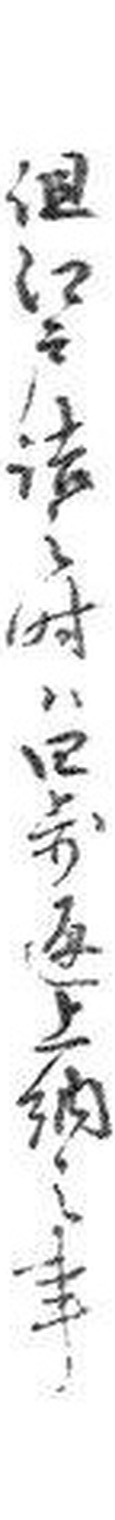但江戸詰之時ハ四歩通上納之事
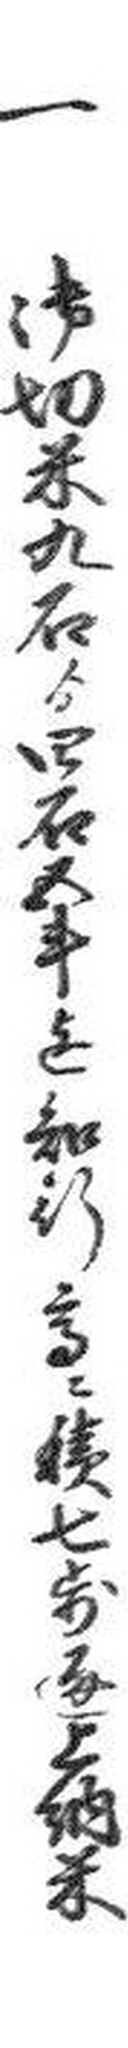一御切米九石ゟ四石五斗迄知行高ニ積七歩通上納米
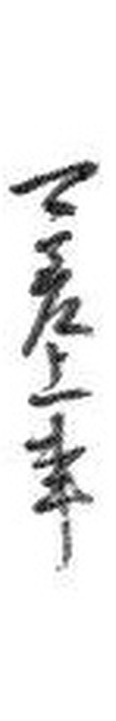可差上事
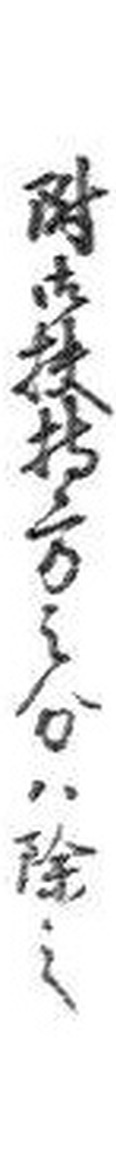附御扶持方之分ハ除之
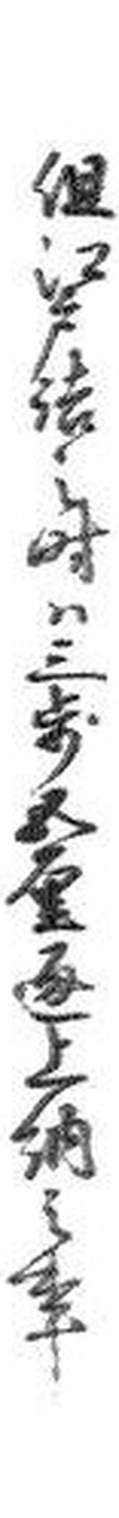但江戸詰之時ハ三歩五厘通上納之事
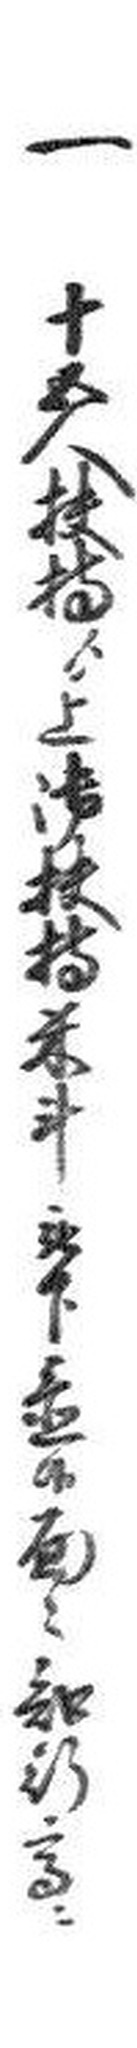一十五人扶持ゟ上御扶持米斗被下置候面々知行高ニ
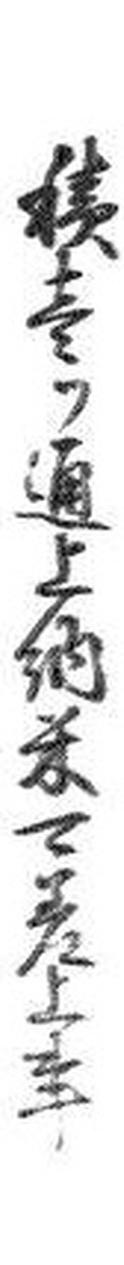積壱ツ通上納米可差上事
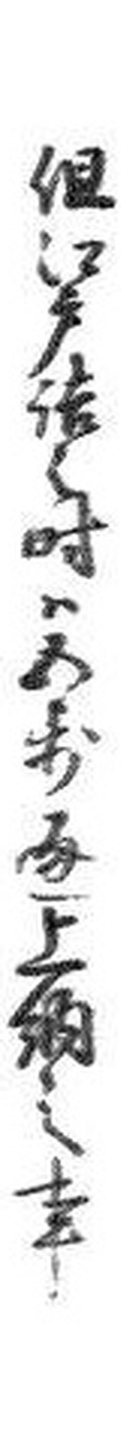但江戸詰之時ハ五歩通上納之事
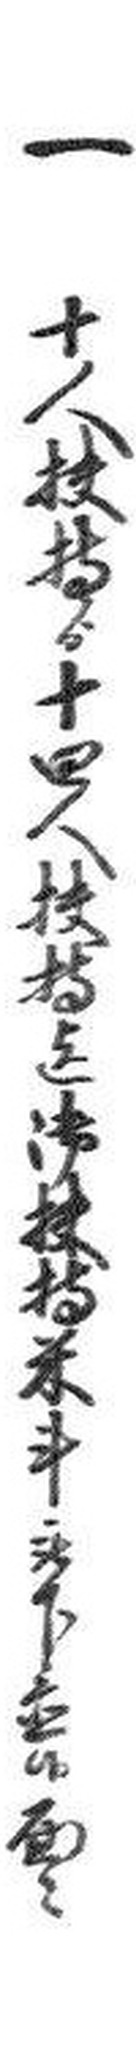一十人扶持ゟ十四人扶持迄御扶持米斗被下置候面々
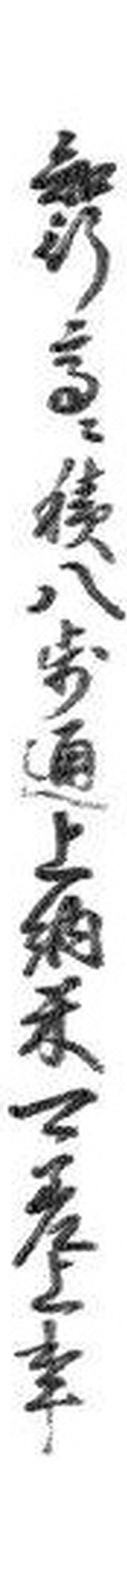知行高ニ積八歩通上納米可差上事
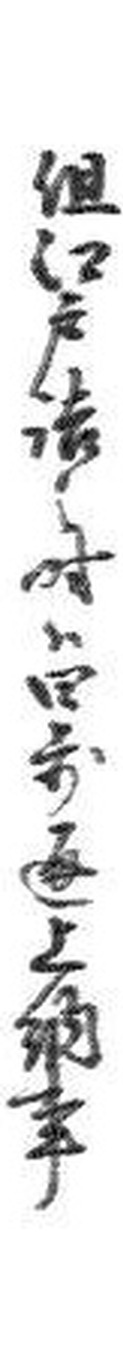但江戸詰之時ハ四歩通上納事
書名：家譜 二十三 吉品公 従宝永元年到同二年
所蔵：福井県文書館 Fukui Prefectural Archives
